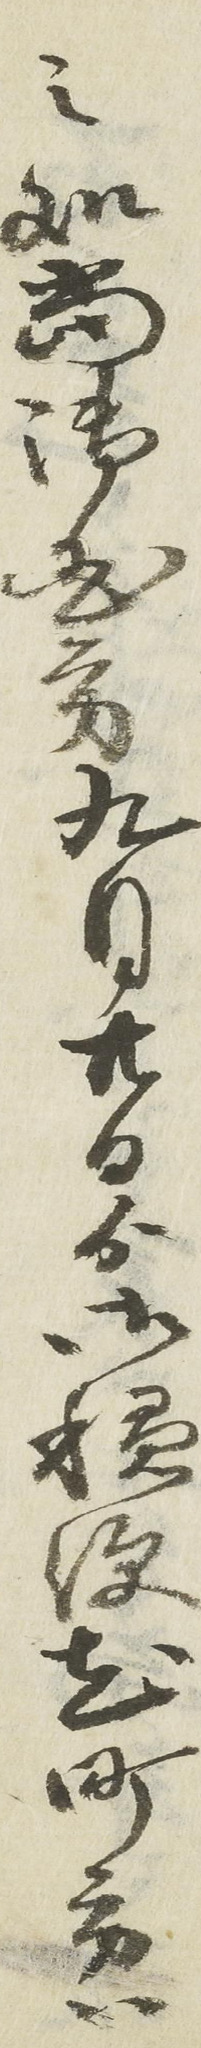之処当御国方九月廿日ゟ御穏便尤町方は
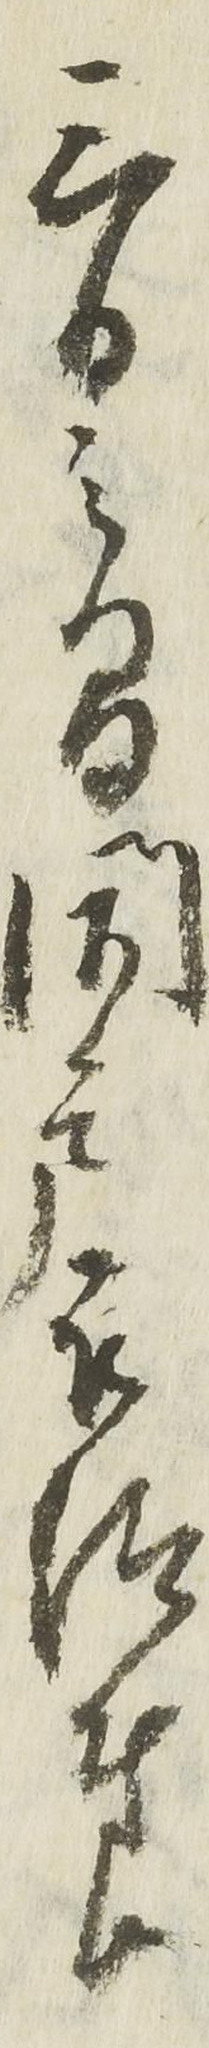三日之間閉戸被仰付候
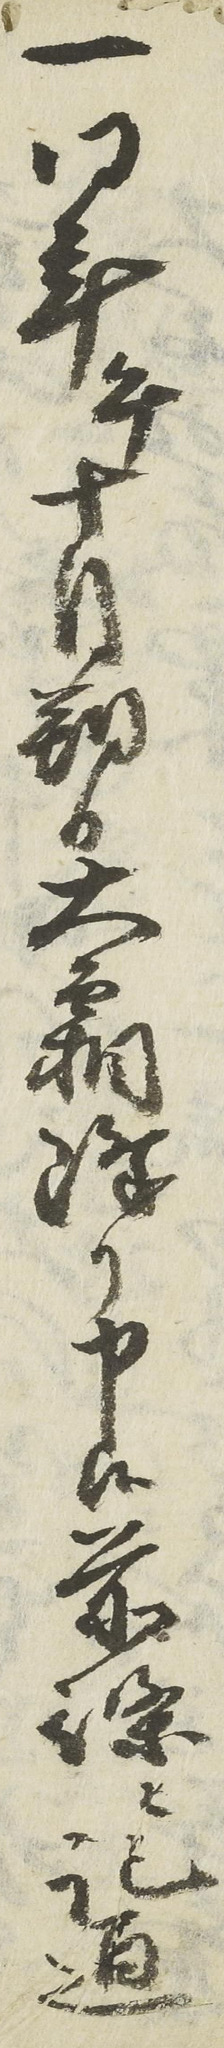一同年午十月朔日大霜降り申候前条ニ記通
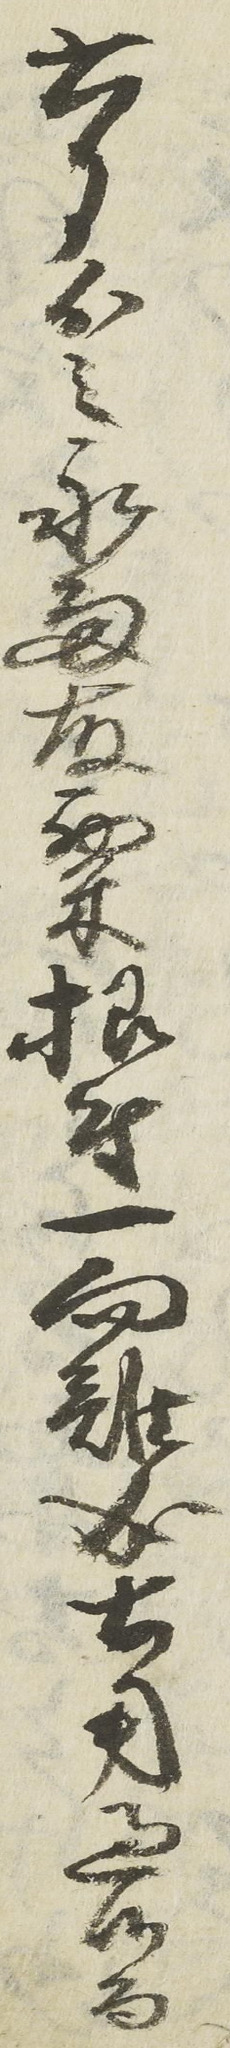六月ゟ之永雨故粟根付一向難成土用過候而
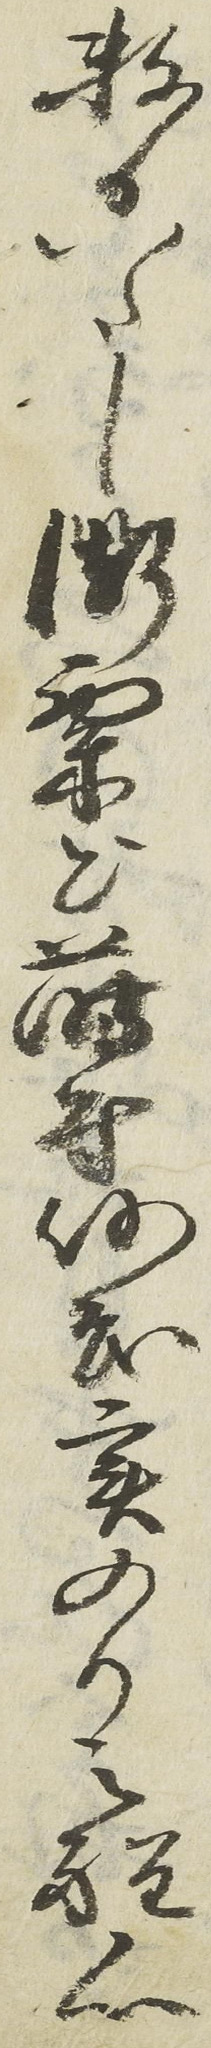数日いたし漸粟を蒔付何も実のり之程以

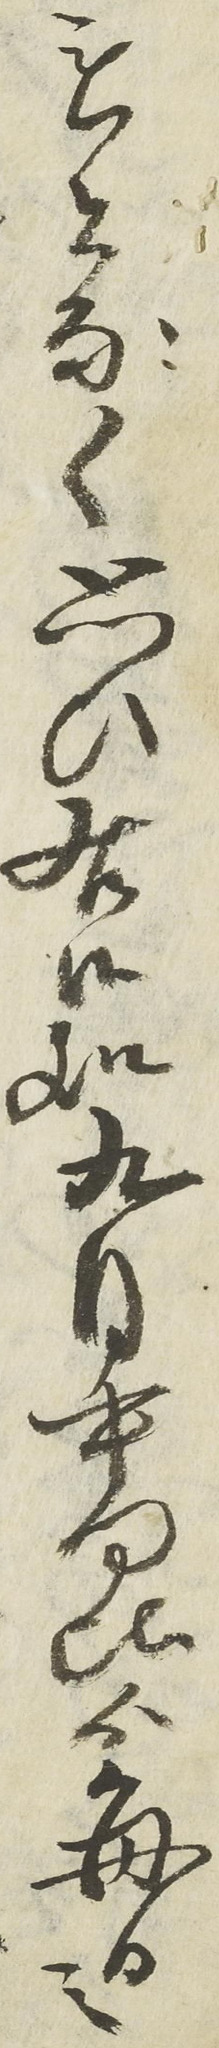もとなく思ひ居候処九月中旬比ゟ毎日之
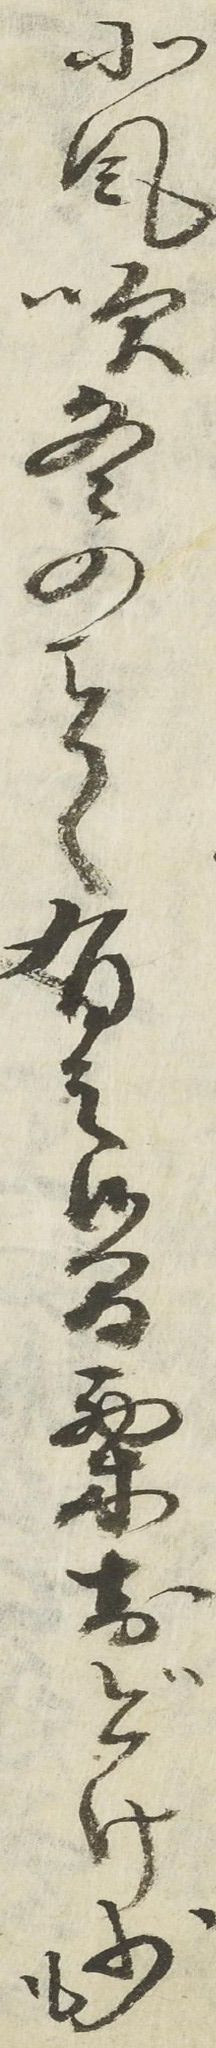北風吹冬のことく有之候間粟おどけ少も
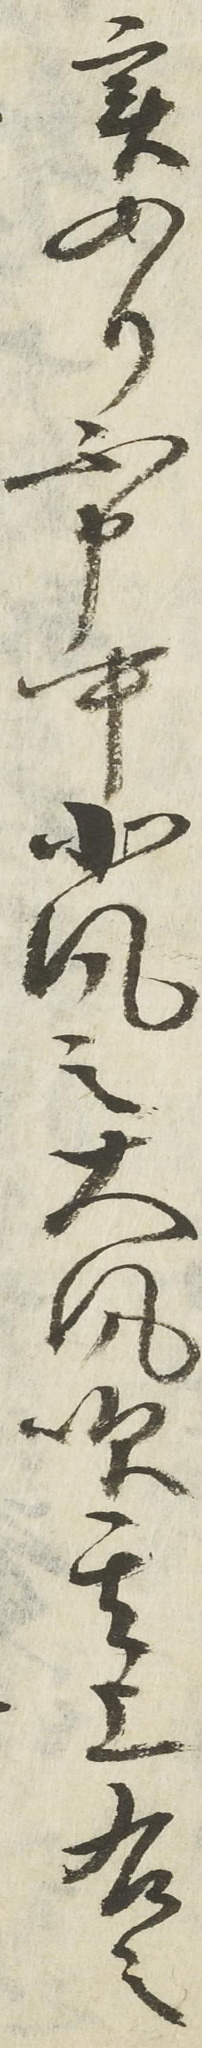実のり不申中北風之大風吹其上右之
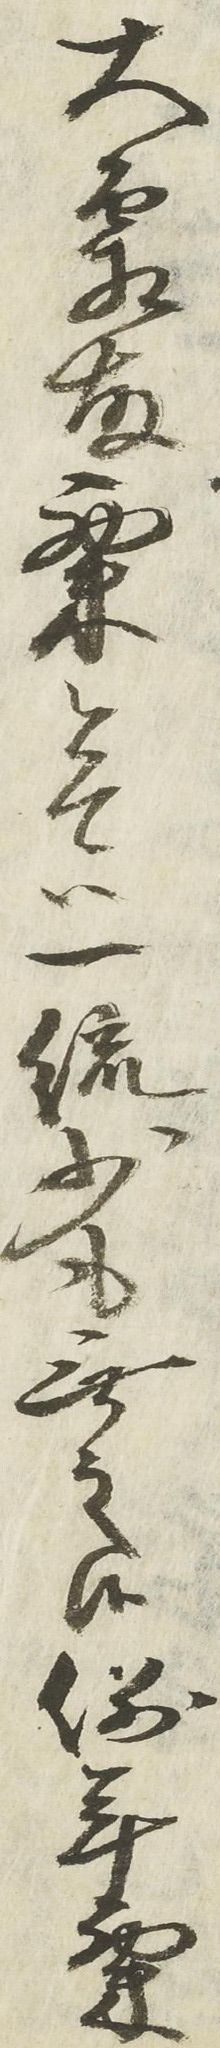大霜故粟とては一統少も無之候例年粟
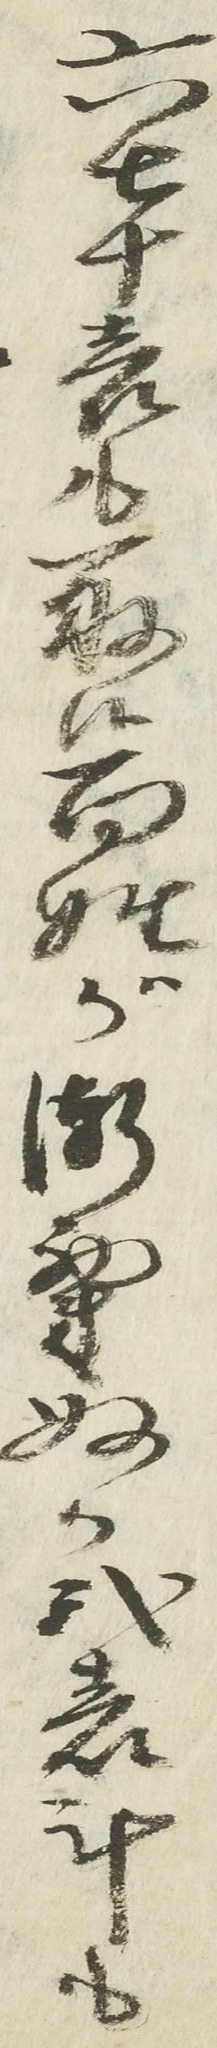六七十表も取候百姓が漸粟ぬか弐表計も
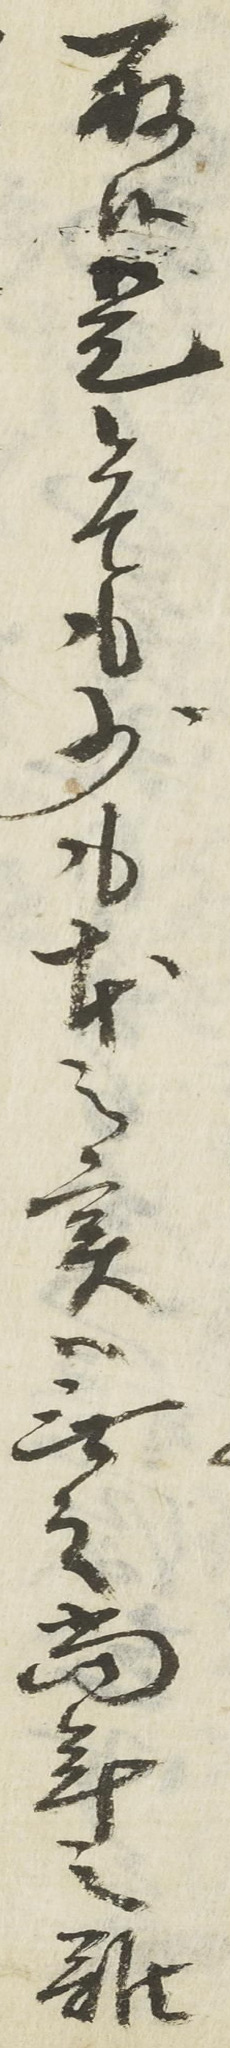取候是とても少も本の実は無之当年之難
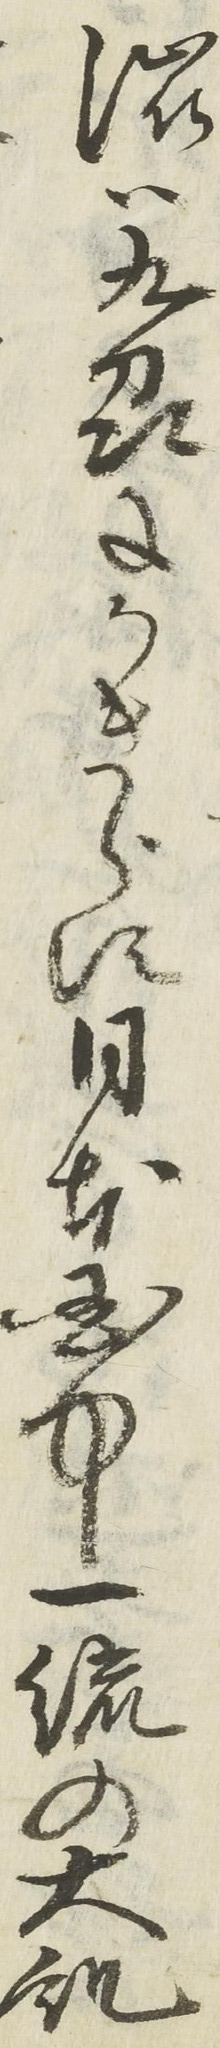渋は九州にかきらす日本国中一統の大飢
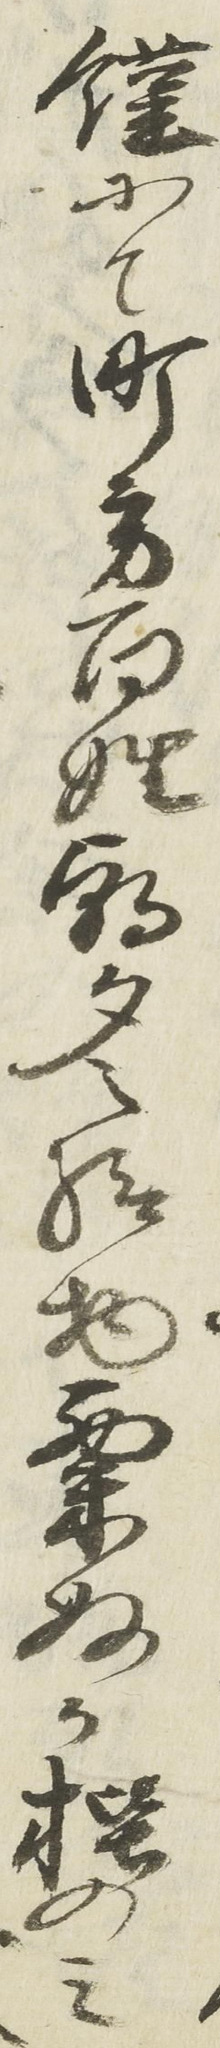饉にて町方百姓朝夕之給物粟ぬか欅のみ
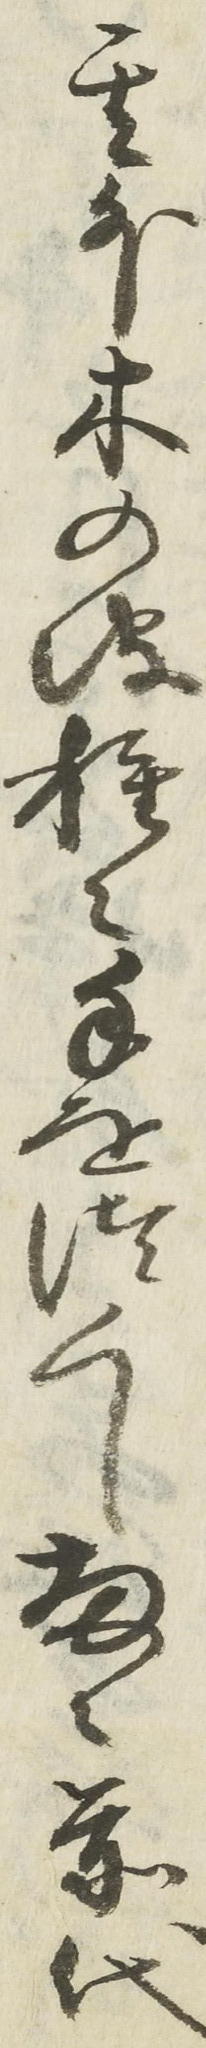其外木の皮種〻手をつくし扨〻前代
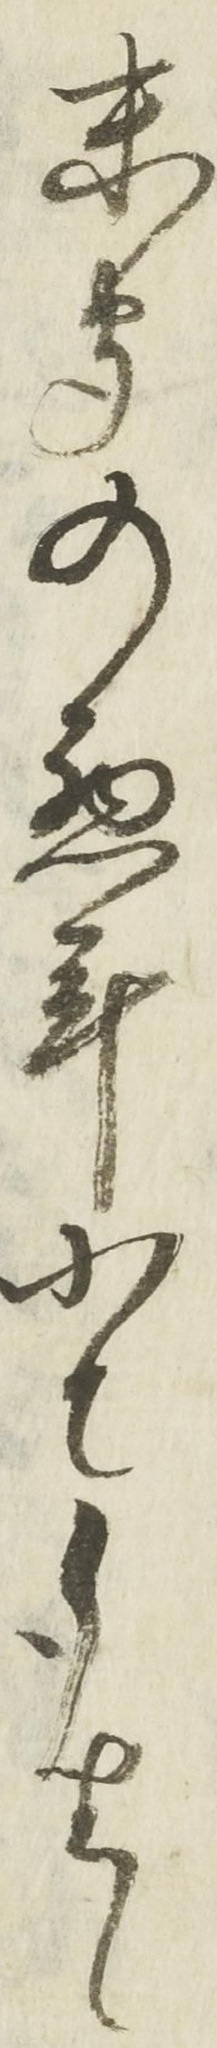未聞の悪年にて御坐候
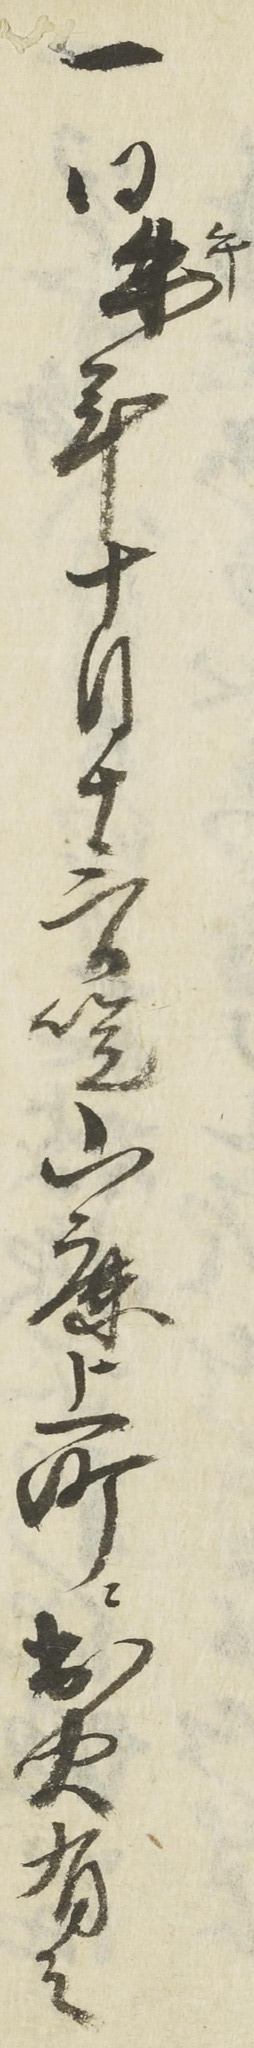一同午年十月十三日晩山鹿上町ニ出火有之
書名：後見笑
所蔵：東京大学地震研究所図書室 Earthquake Research Institute Library, The University of Tokyo, JAPAN
